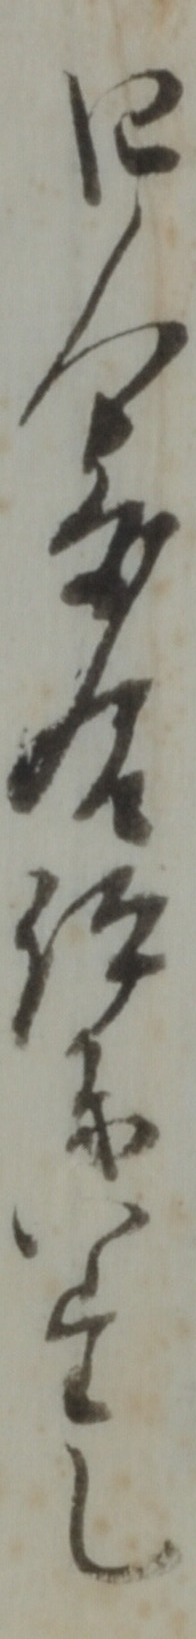四人寄合詮義いたし
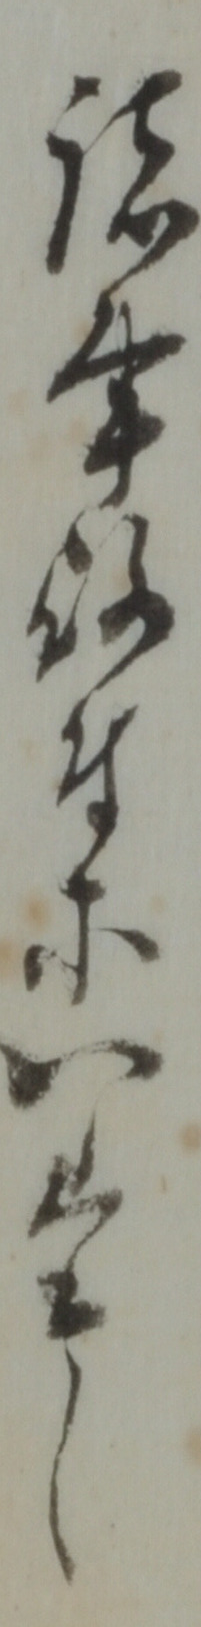諸事役付等いたし
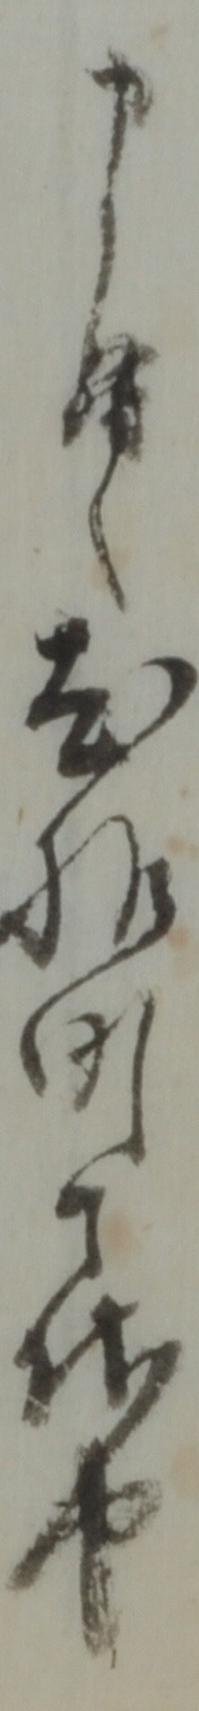申請候尤拾町丁代中
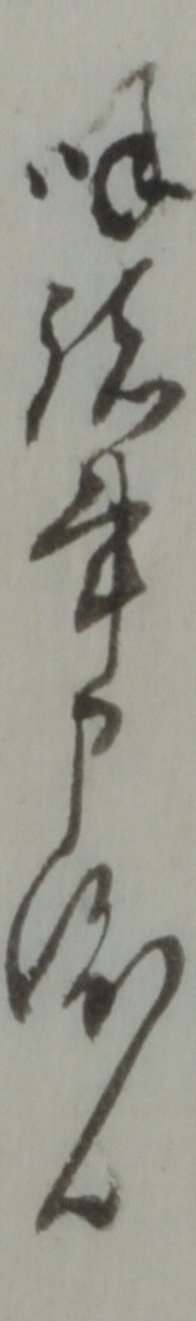呼諸書申渡候
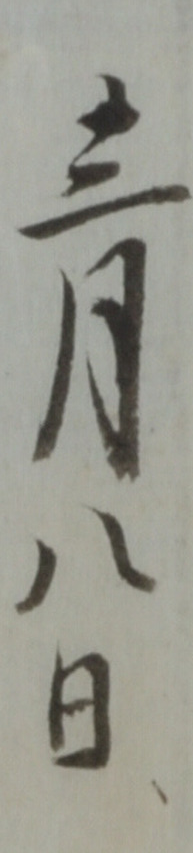十二月八日
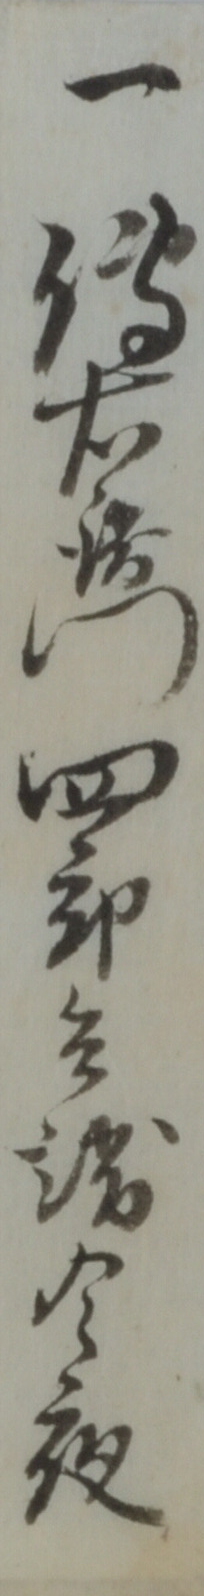一伝右衛門四郎兵衛今夜
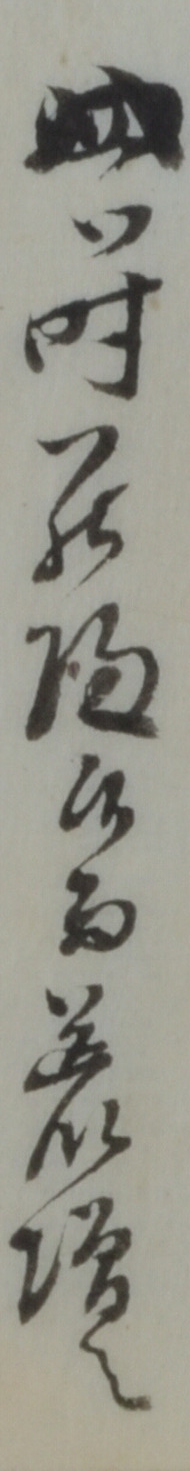八ツ時罷帰候而着増之
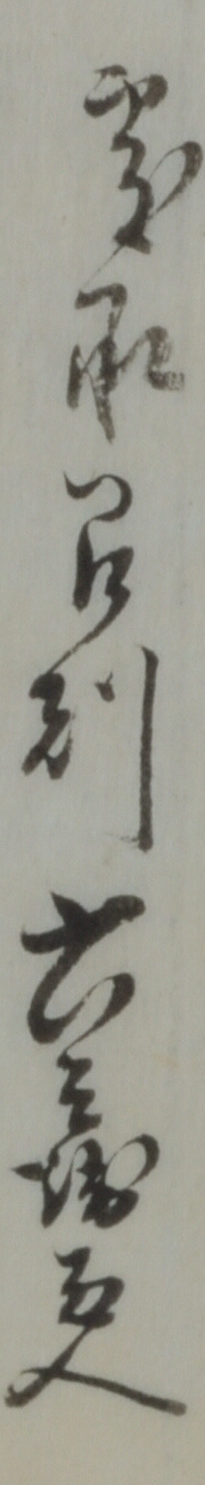処承即刻六兵衛両人
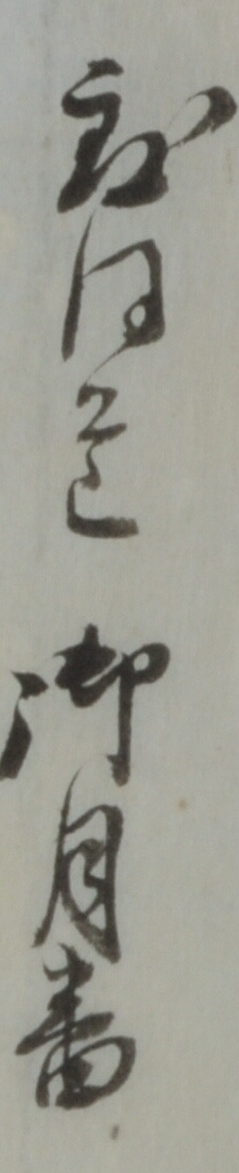致同道御月番

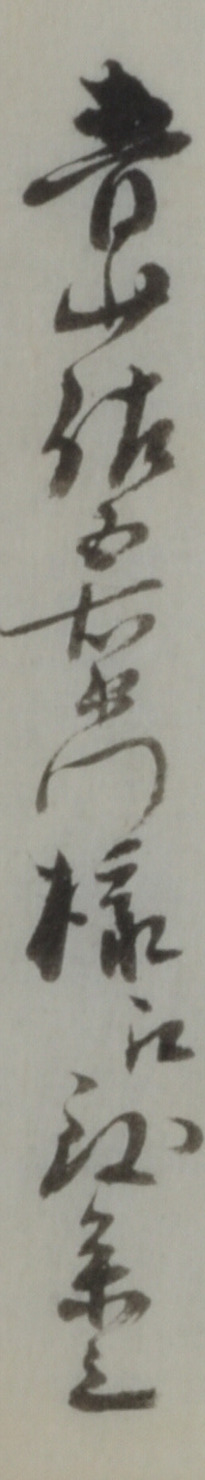青山佐五右衛門様江致参上
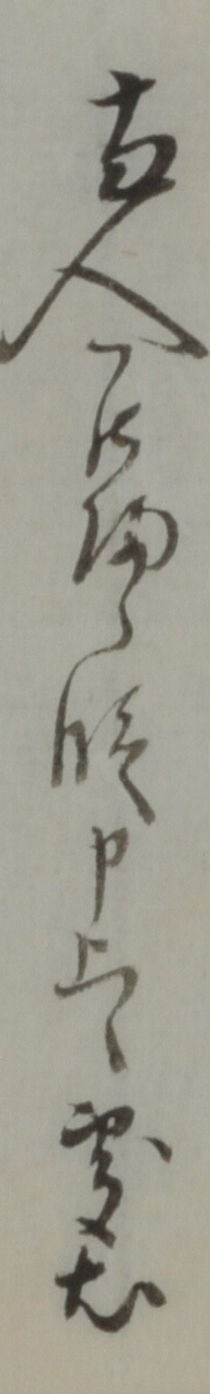両人罷帰候段申上候処右
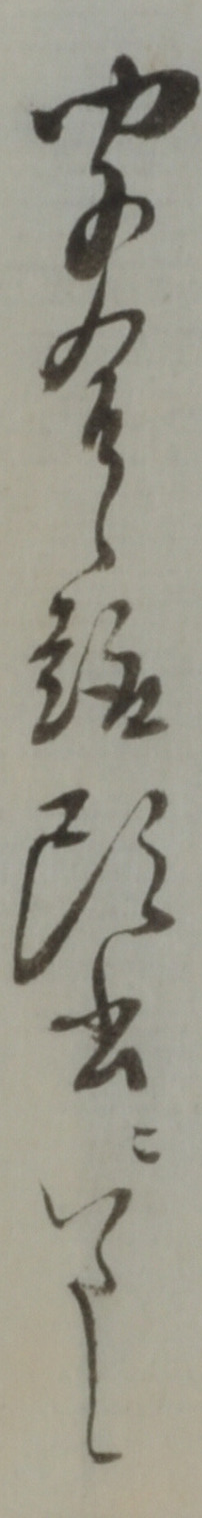聞合之趣頭書ニいたし
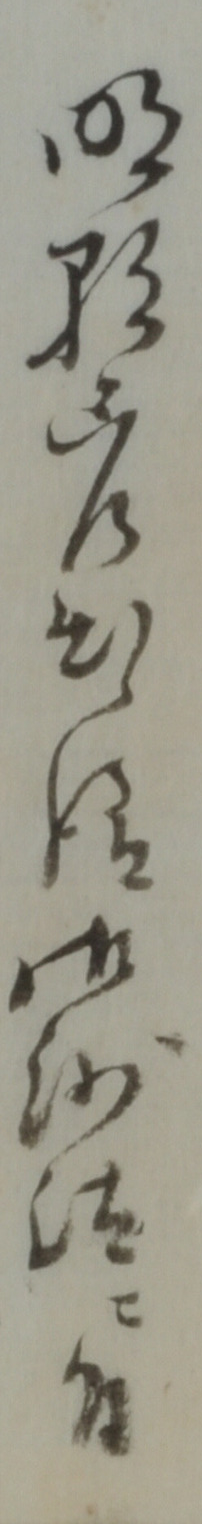明朝差出候様御沙汰ニ付
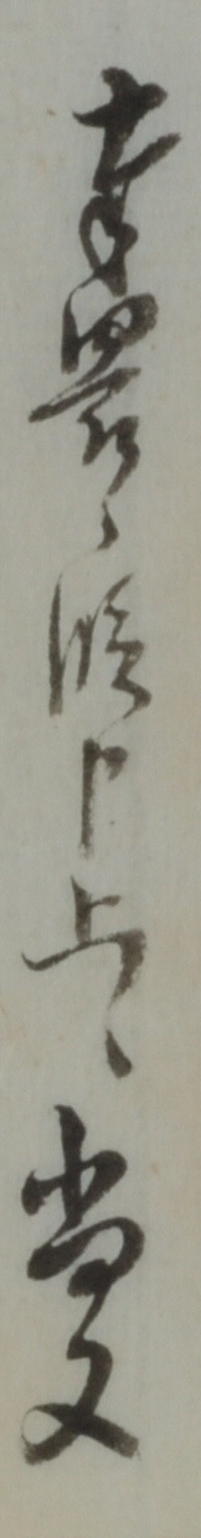奉畏候段申上候尚又
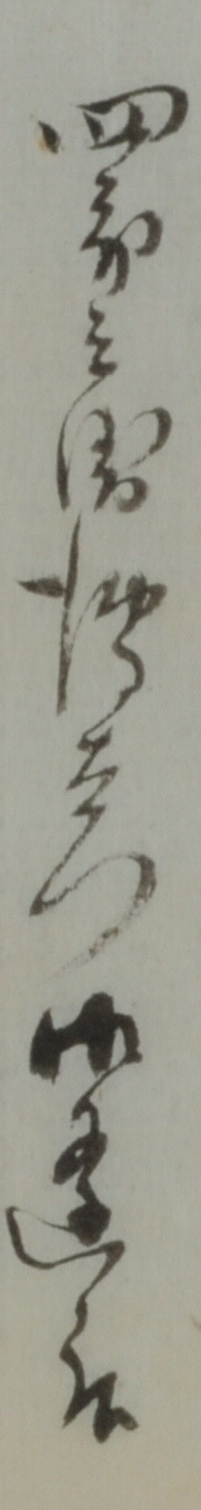四郎兵衛伝右衛門御逢被
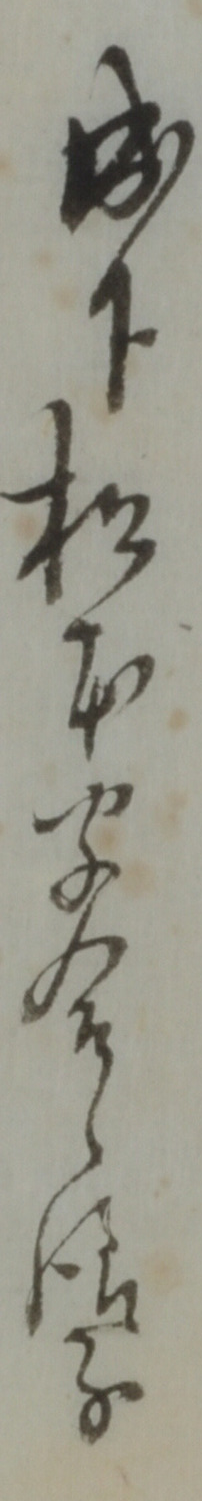城下松本聞合候様子
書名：御勘定御普請役江戸御役人様諸事控
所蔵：伊那市立高遠町図書館・合同会社AMANE
